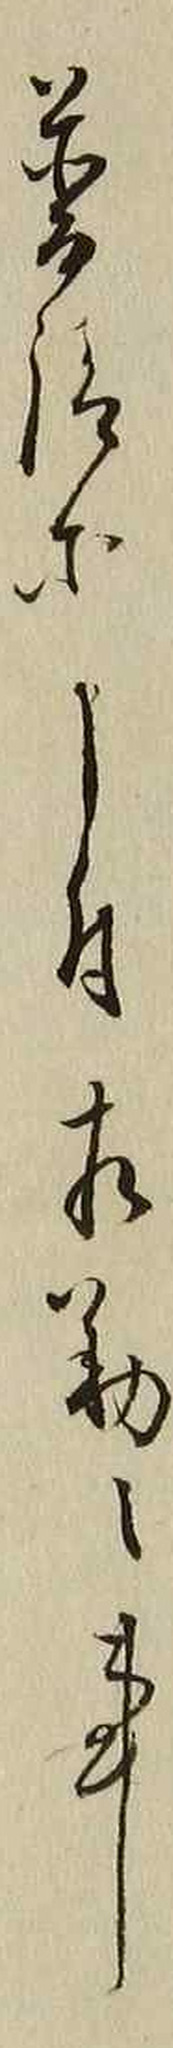普請等申付相勤之事
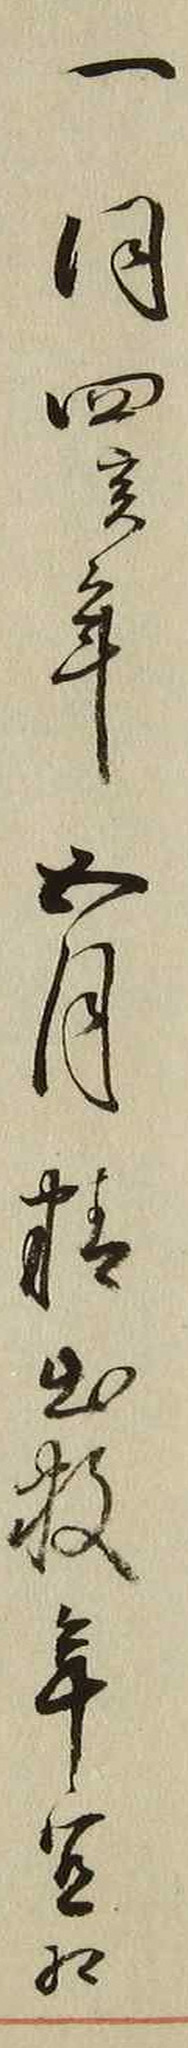一同四亥年五月精出数年宜相
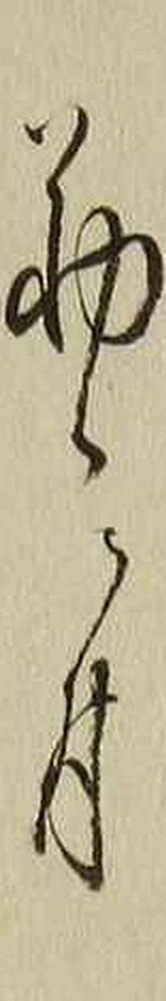勤候ニ付
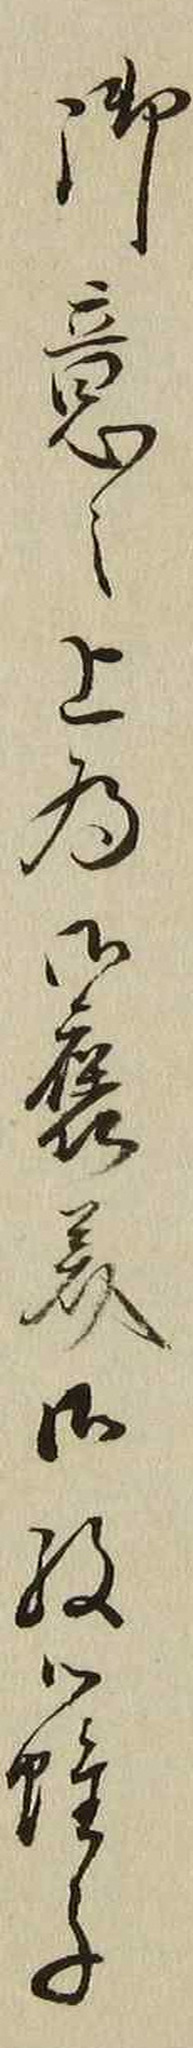御意之上為御褒美御紋御帷子
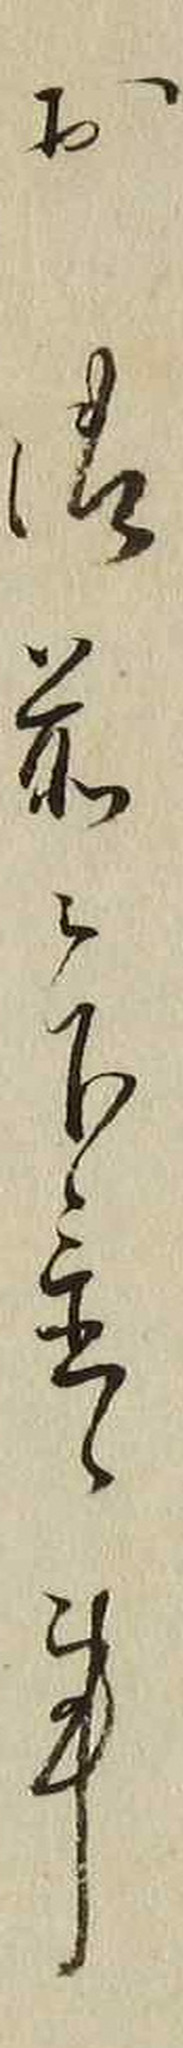於御前被下置候事
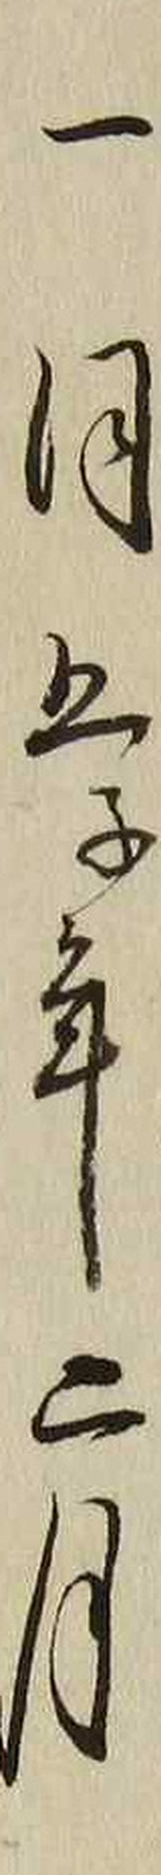一同五年子二月
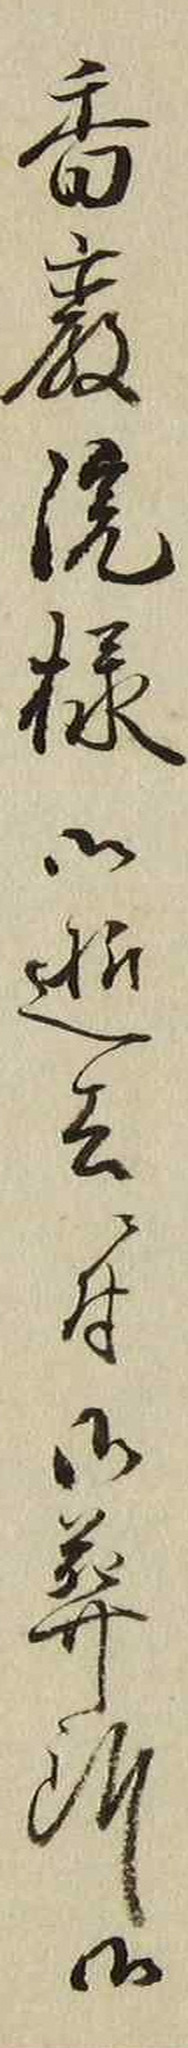香巌院様御逝去ニ付御葬所御
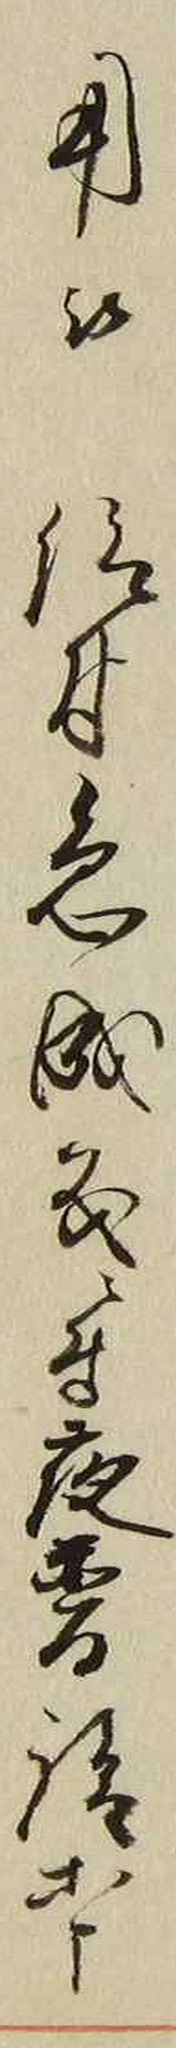用被仰付急成義ニ付夜普請等申
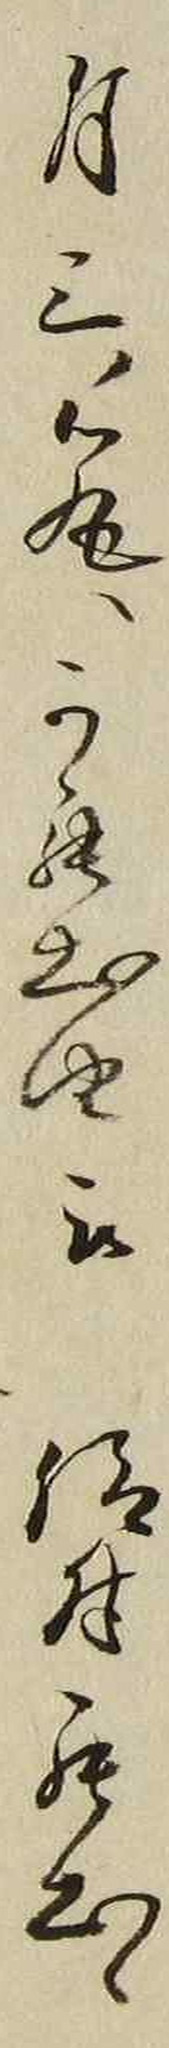付三ノ御丸へ可罷出由被仰付罷出候ゝ
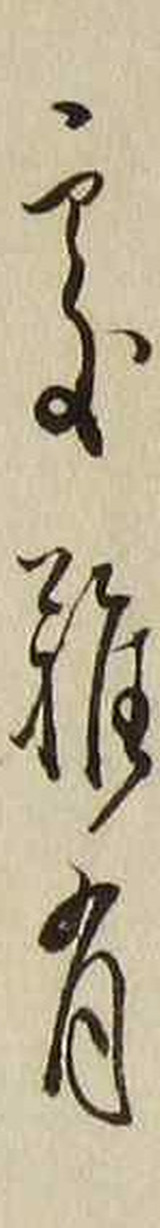処難有
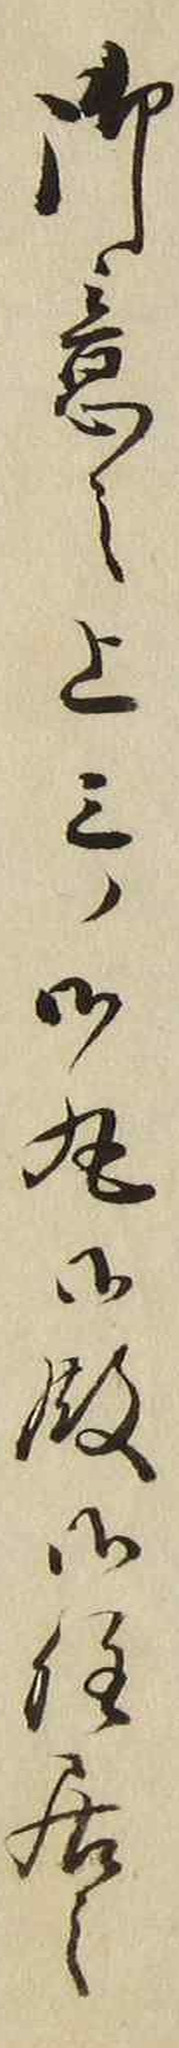御意之上三ノ御丸御殿御住居之

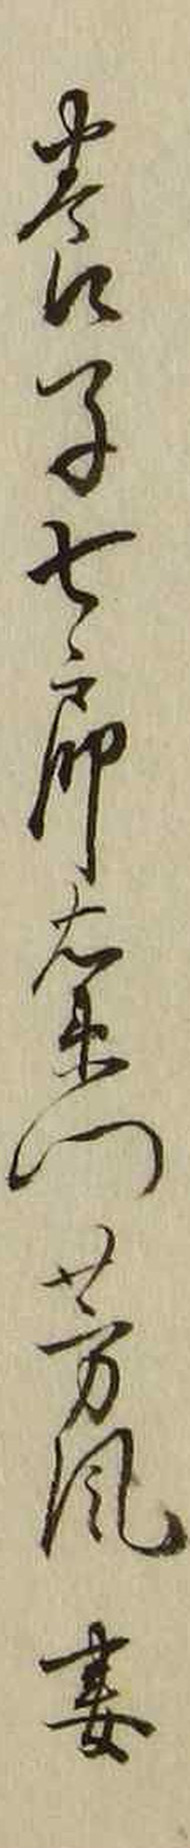女養子七郎右衛門芳風妻
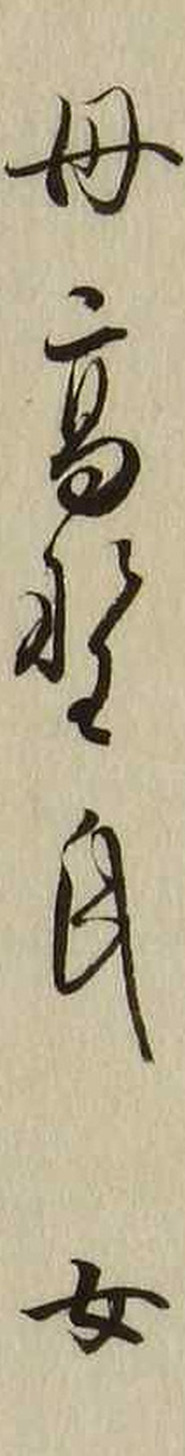母高野氏女
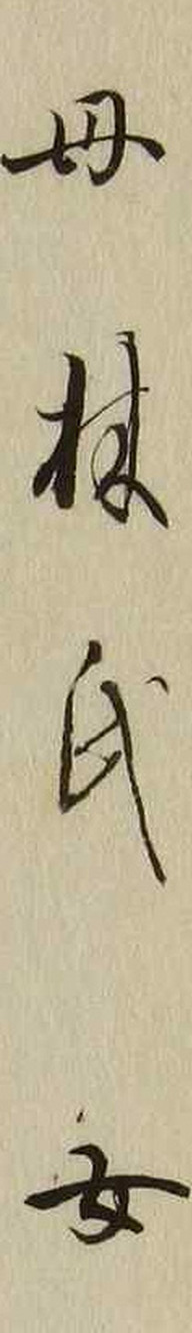母林氏女
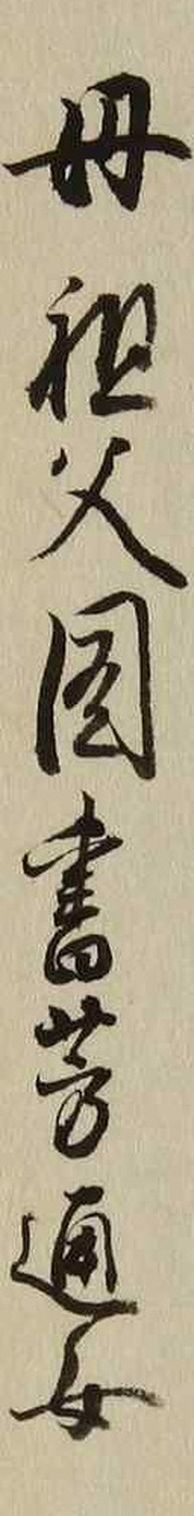丹祖父図書芳通女
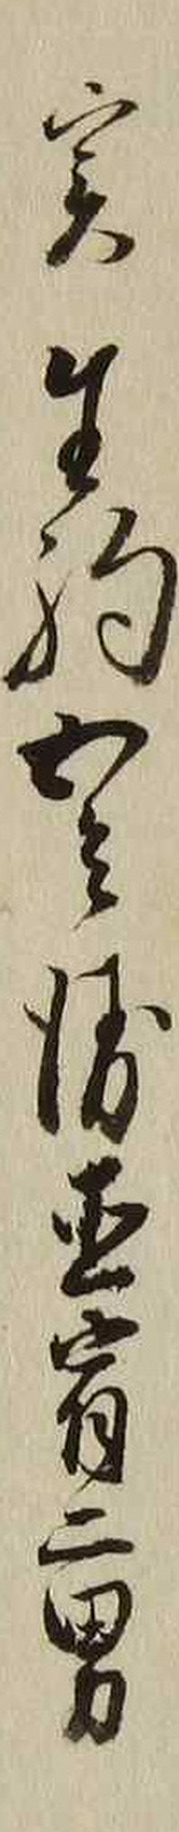実生駒五兵衛直宥二男
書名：諸士系譜　巻之1　い之部1
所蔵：会津若松市立会津図書館
